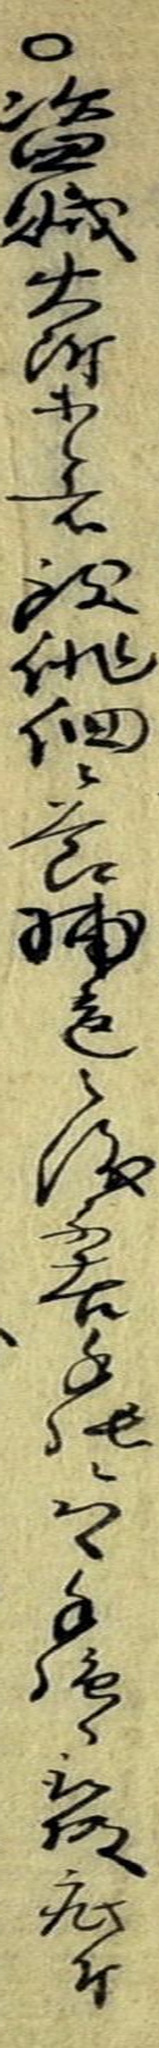○盗賊火附等之者致徘徊候節捕違之儀不苦手張候はヽ手強く取扱疵付
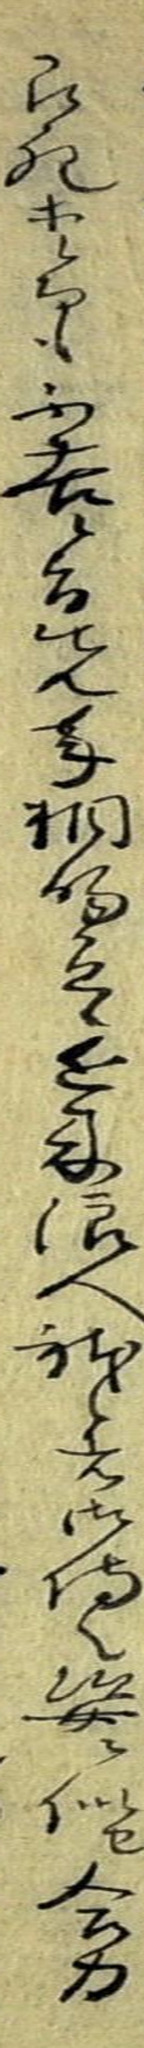即死等候而も不苦候候間先年相唱置候近来浪人体之者御侍之姿に似セ合力
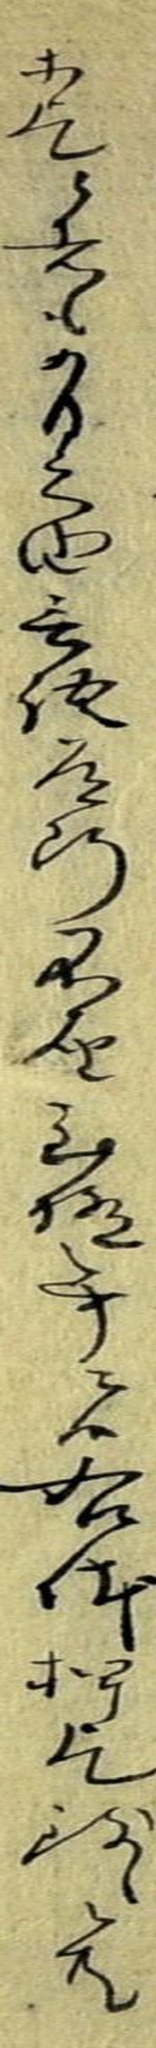相乞候者も有之由言語同断不届至極之事に候右体押乞致し候共
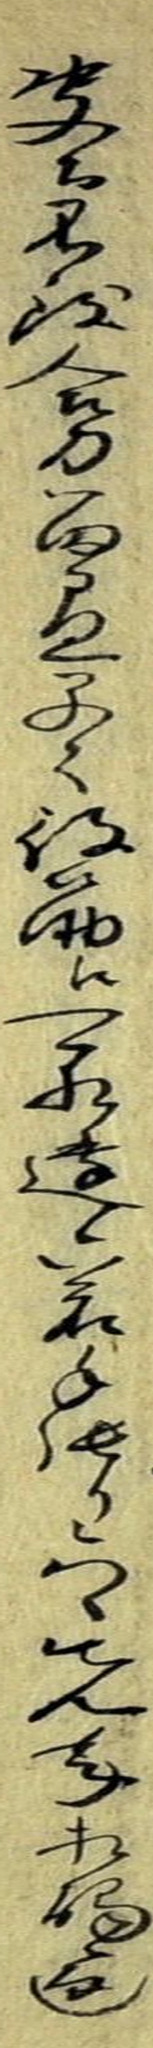決而不致合力留置早々役筋江可相達候若手張候はヽ先年相触候通
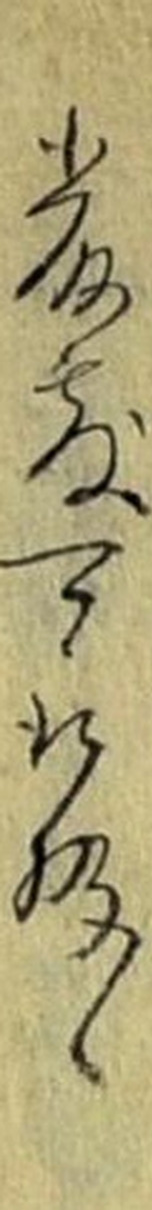厳敷可取扱候
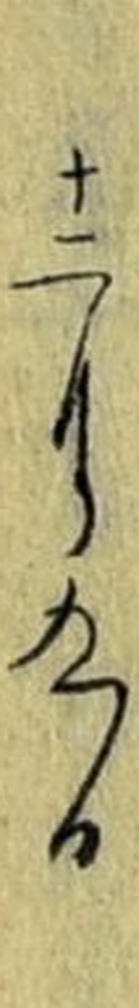十二月九日

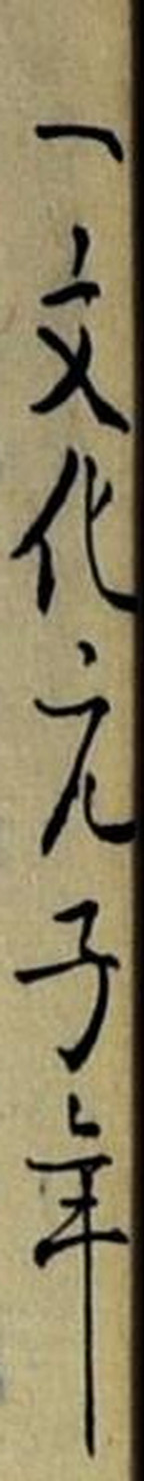一文化元子年
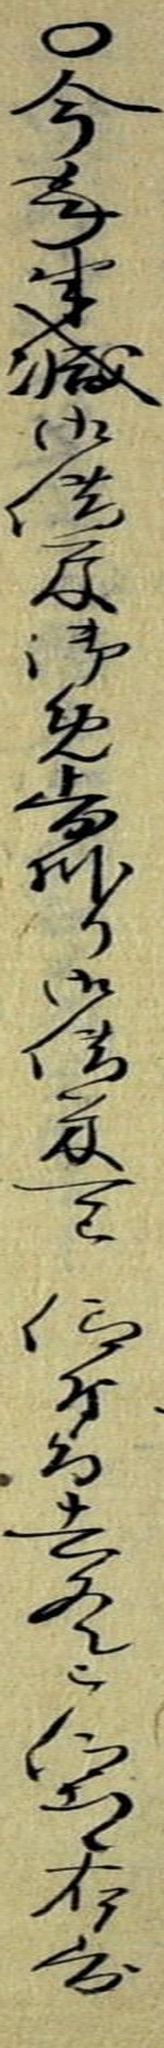○今年半減御借米御免歩掛り御借米可被仰付旨去冬被仰出候右歩
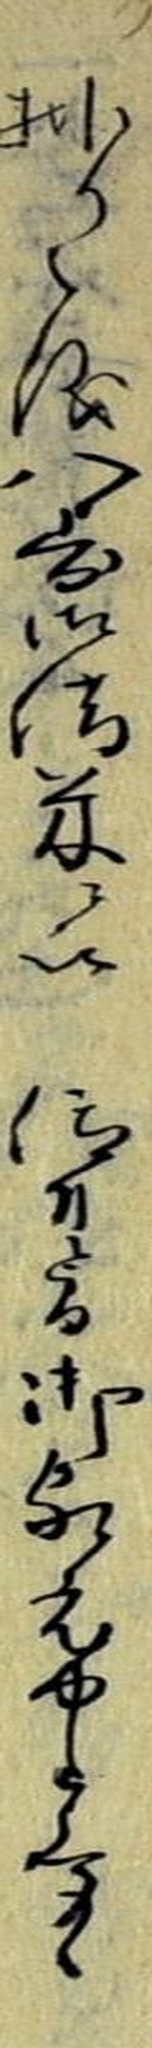掛り之儀八歩御借米に被仰付候間御家老中被申聞候
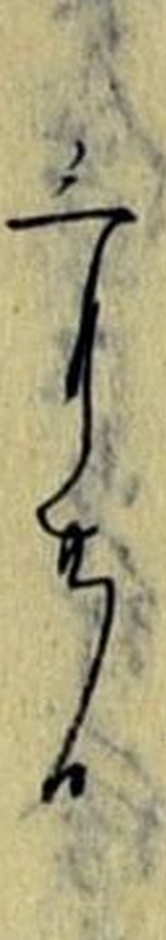三月廿日
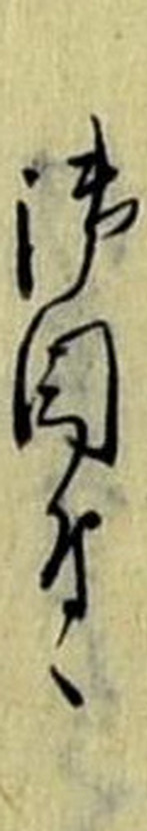御目付へ
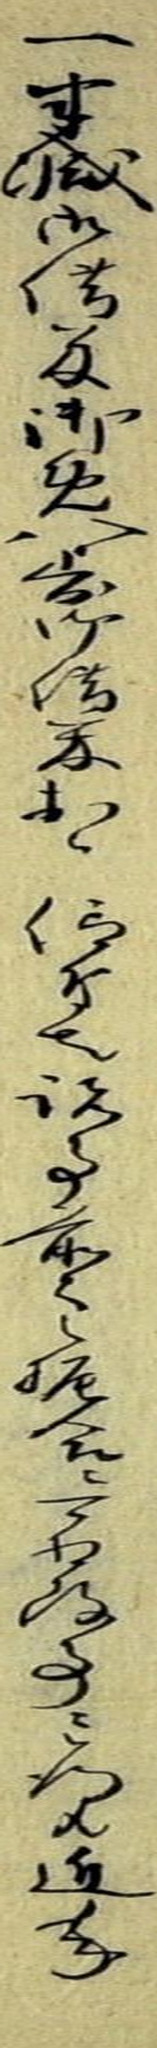一半減御借米御免八歩御借米於被仰付は諸事前々之振合に可相改事に候得共近年
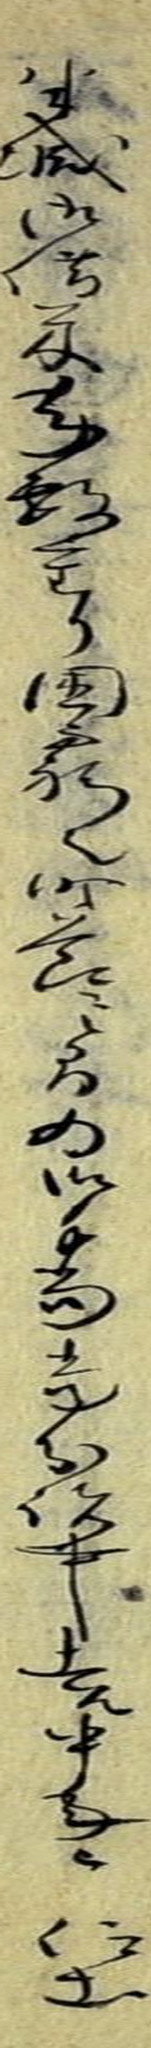半減御借米年数重り困窮之時節に候間為御手当当分諸事去ル申年被仰出
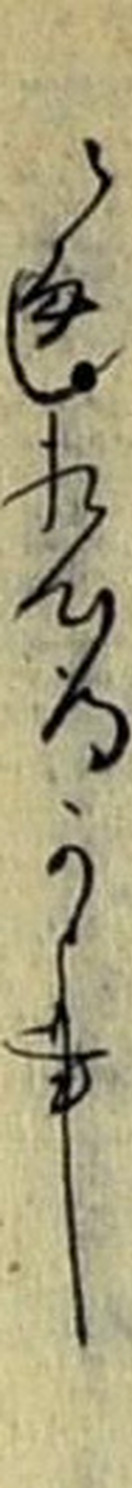候通相心得可申事
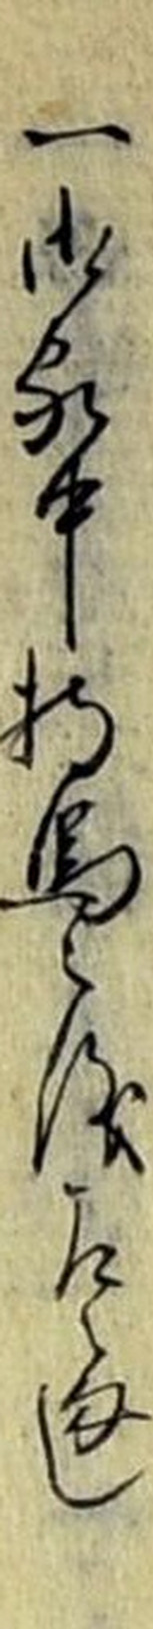一御家中持馬之儀左之通
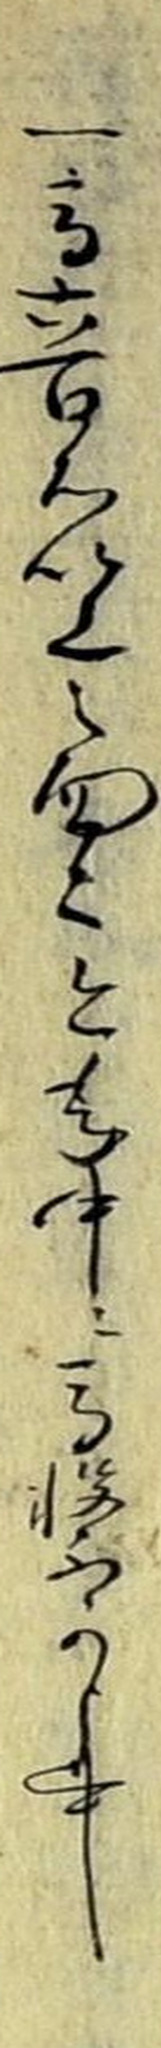一高六百石以上之面々今年中馬繋可申事
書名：命令之部 四
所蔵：福井県文書館 Fukui Prefectural Archives
